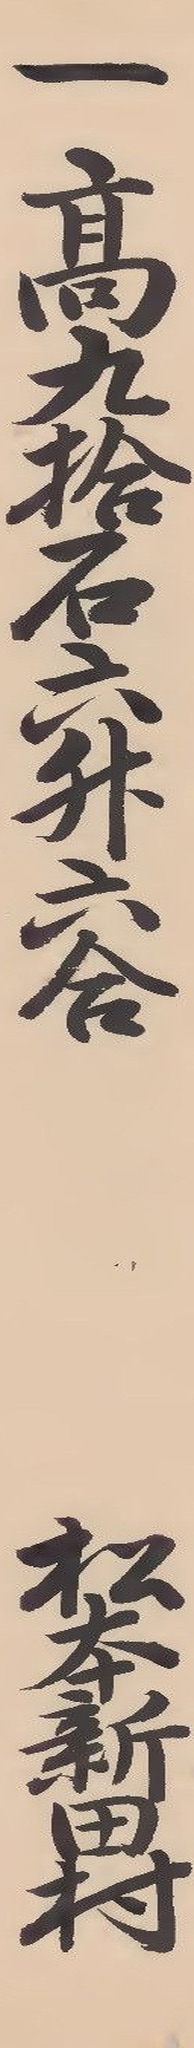一高九拾石六升六合松本新田村
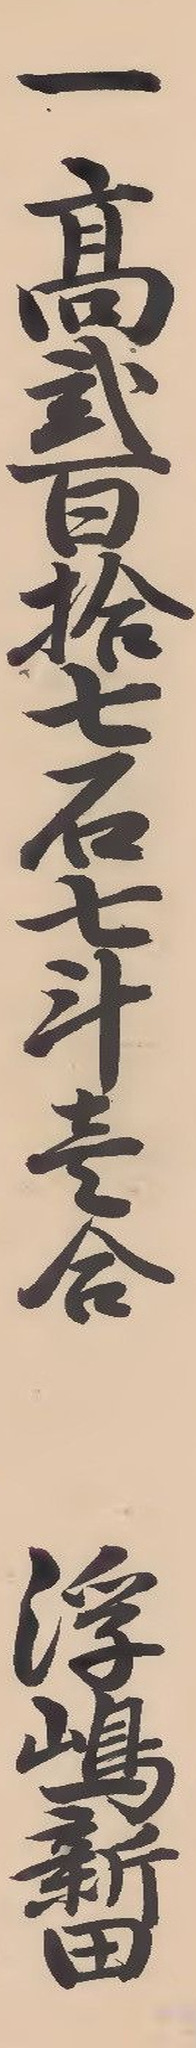一高弐百拾七石七斗壱合浮島新田
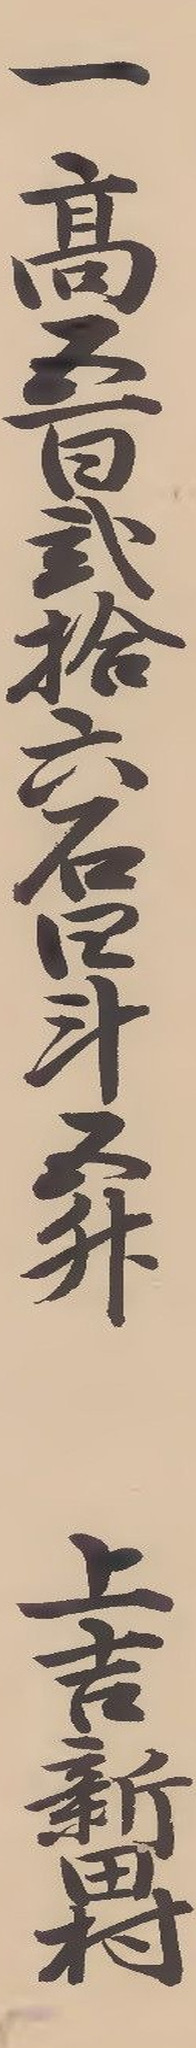一高五百弐拾六石四斗五升上吉新田村
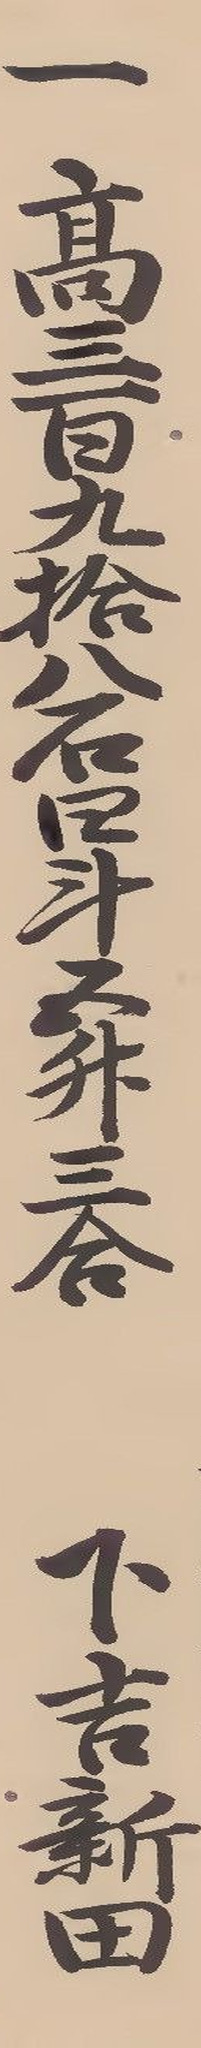一高三百九拾八石四斗五升三合下吉新田
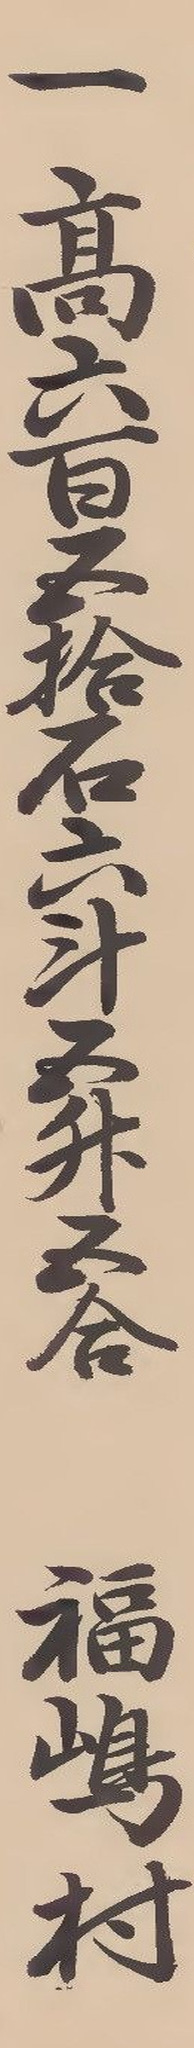一高六百五拾石六斗五升五合福島村
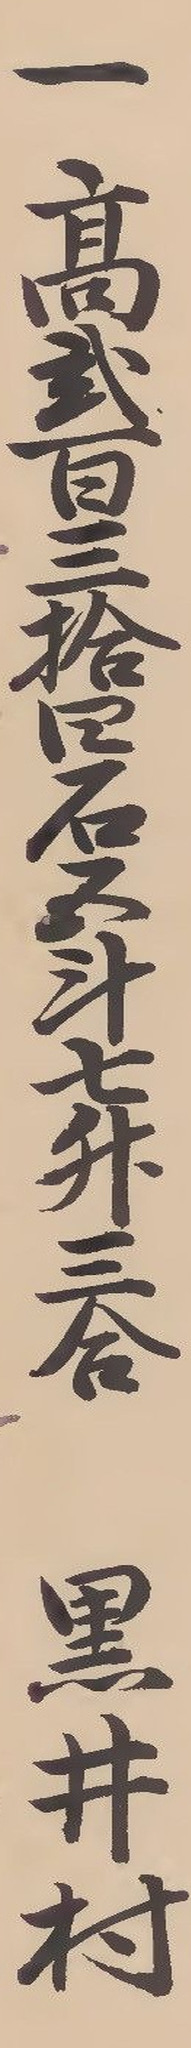一高弐百三拾四石五斗七升三合黒井村

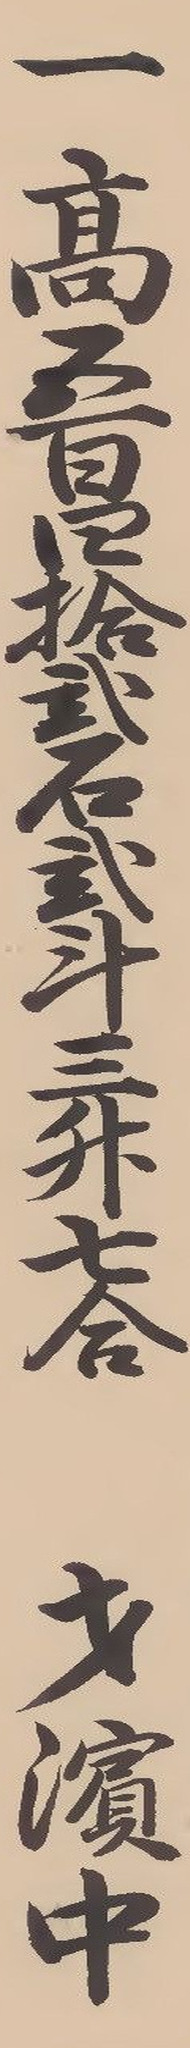一高五百四拾弐石弐斗三升七合才浜中
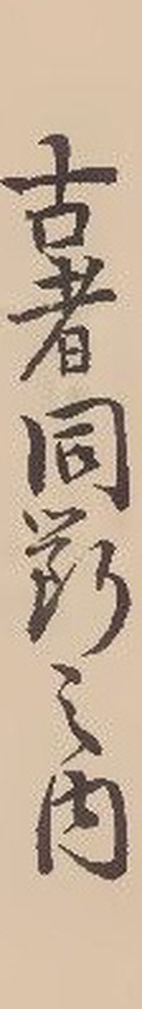古者同断之内
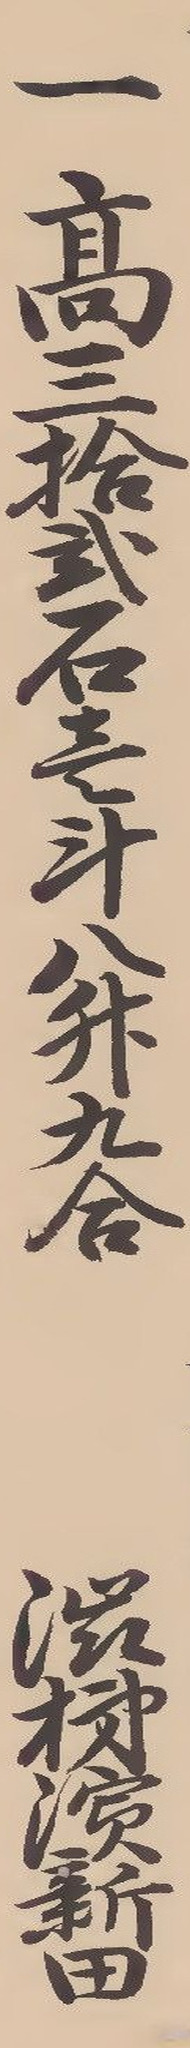一高三拾弐石壱斗八升九合渋柿浜新田
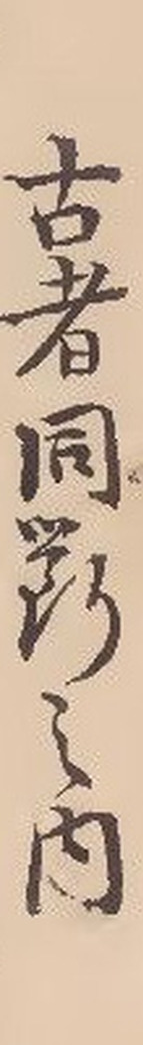古者同断之内
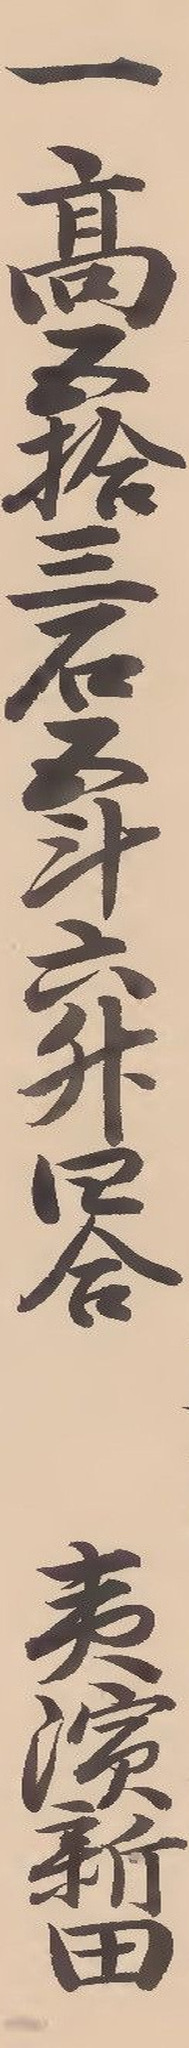一高五拾三石五斗六升四合夷浜新田
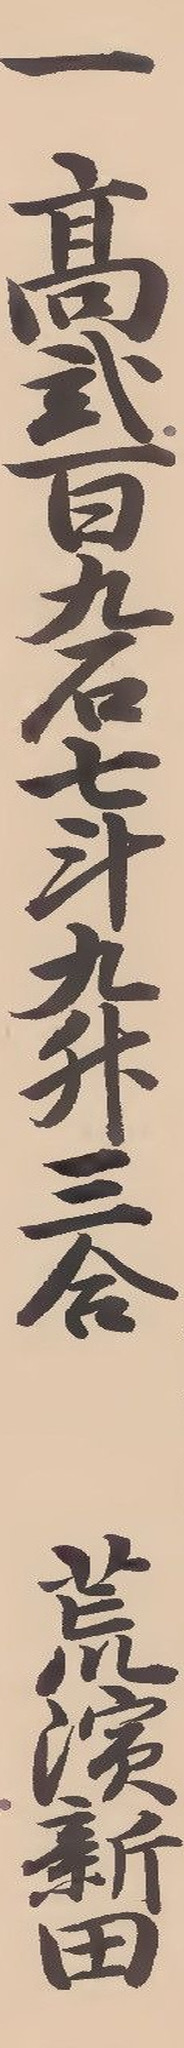一高弐百九石七斗九升三合荒浜新田
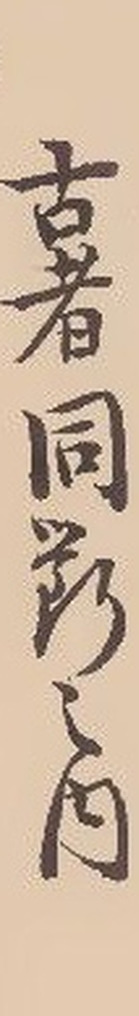古者同断之内
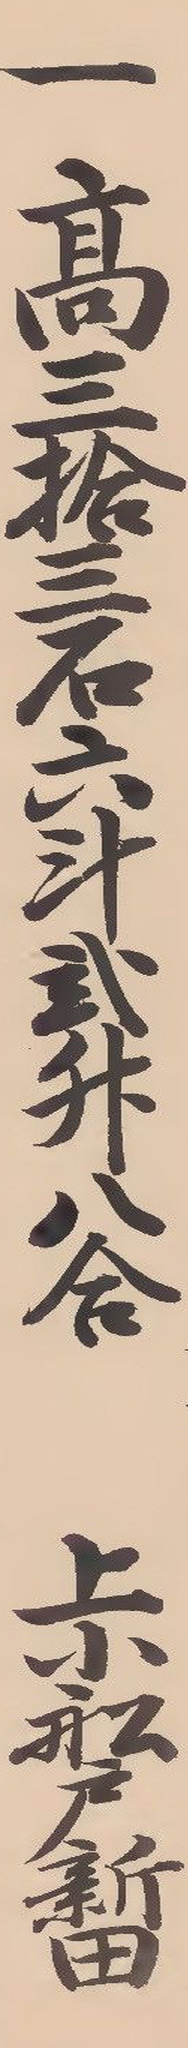一高三拾三石六斗弐升八合上小舩戸新田
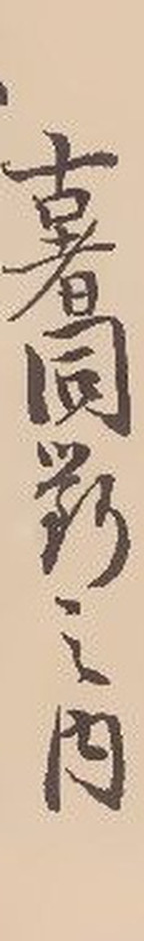古者同断之内
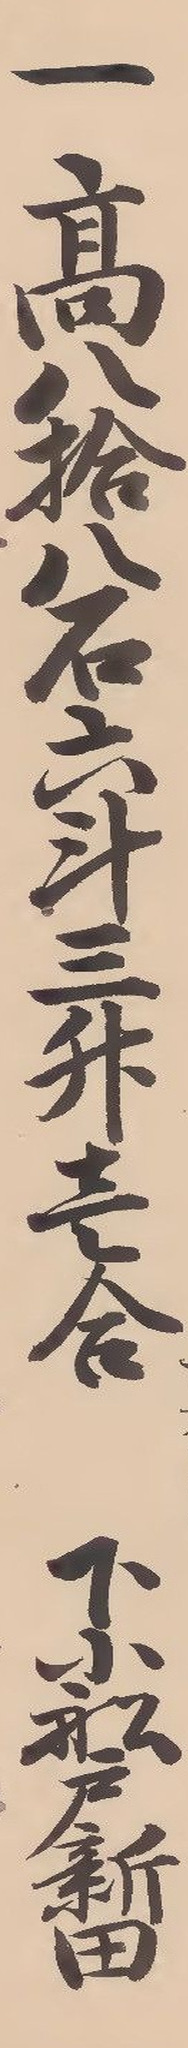一高八拾八石六斗三升壱合下小舩戸新田
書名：越後国郷帳　上
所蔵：国立公文書館 National Archives of Japan
